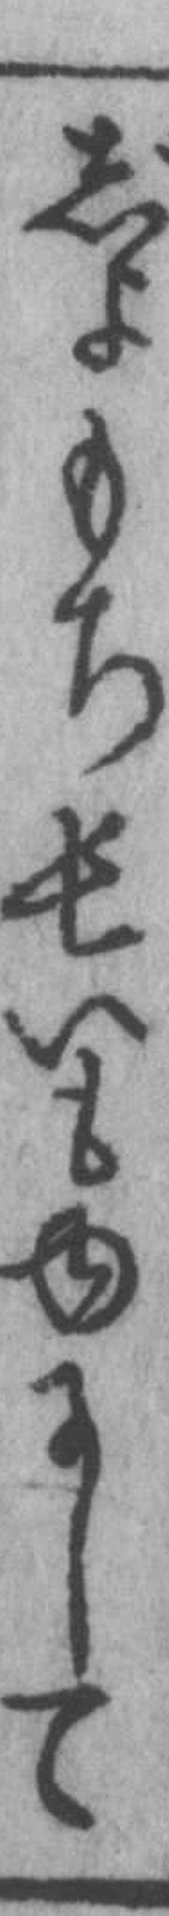じよもち長いもゆにして
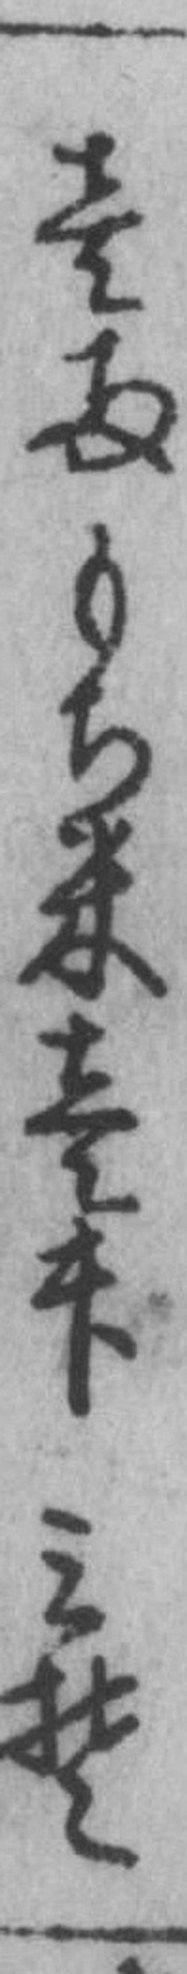壱匁もち米壱斗ミそ
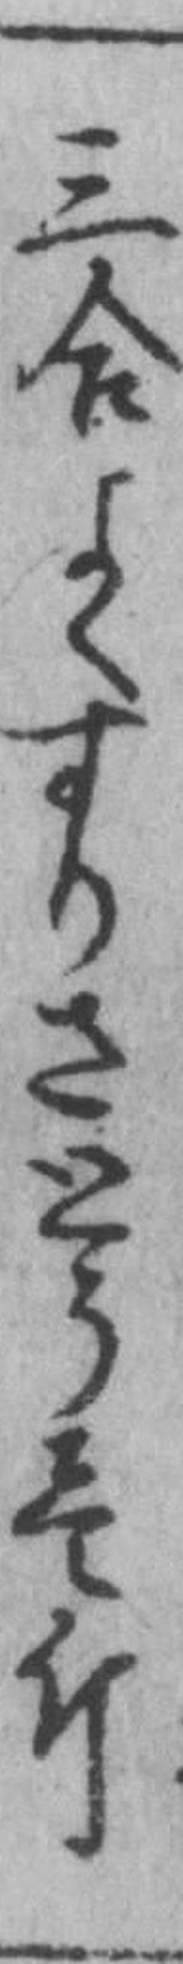三合よくすりさとう壱斤
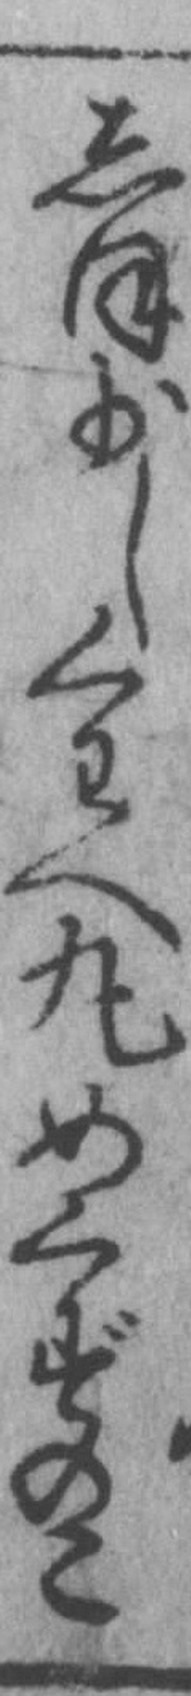しほ少しくわへ丸めくずのこ
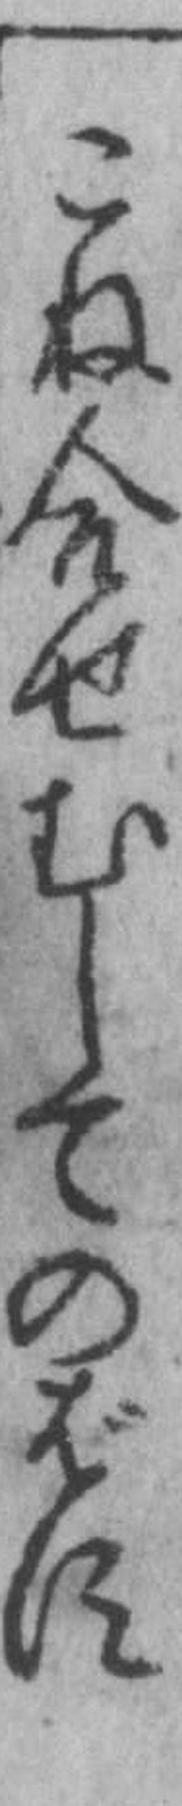こね合せむしてのばす
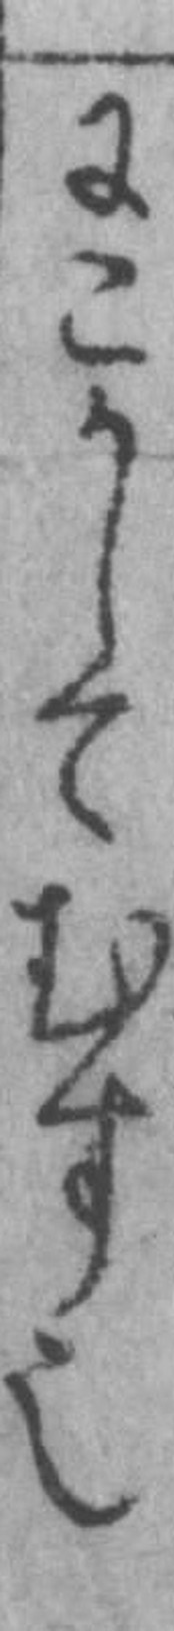にこかしてむす也
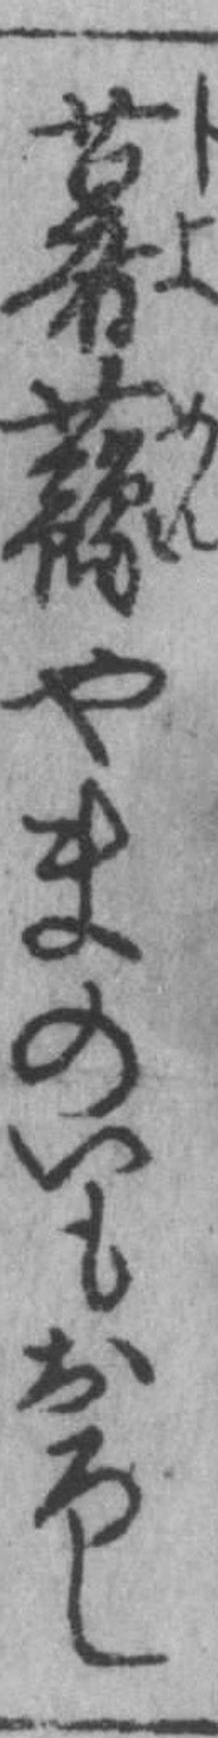薯蕷やまのいもおろし
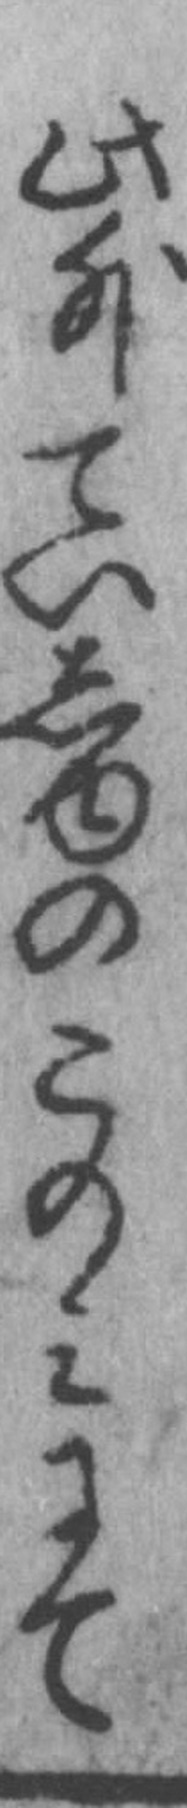此ていしゆのこのミにて
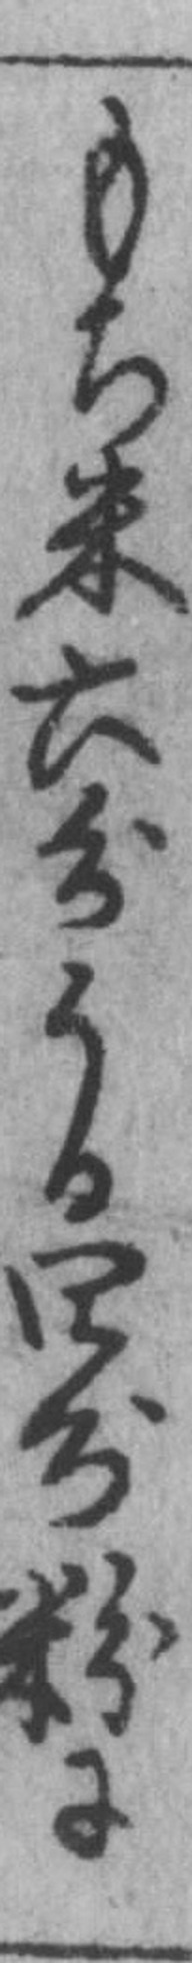もち米六分うる四分粉に
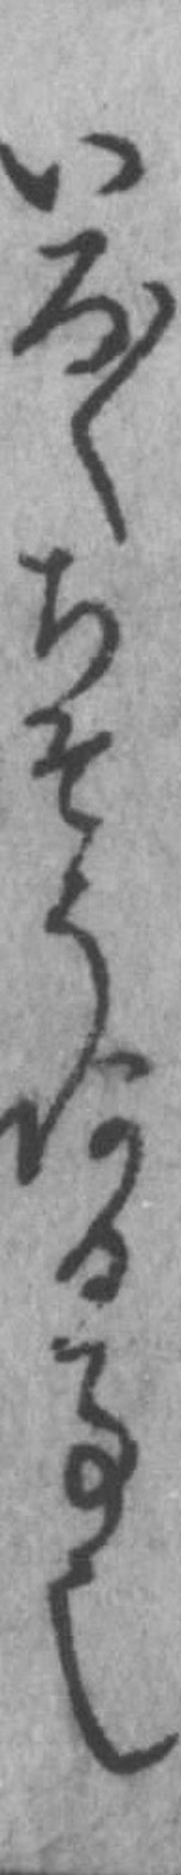いろ〳〵ちそうある也
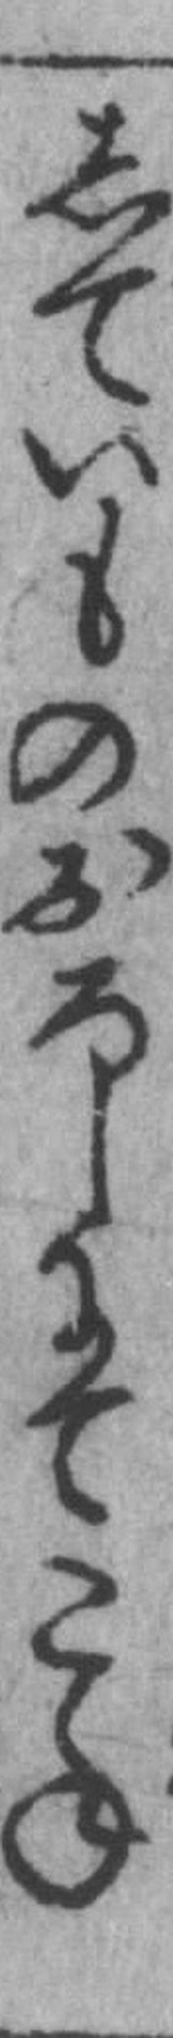していものおろしにてこね
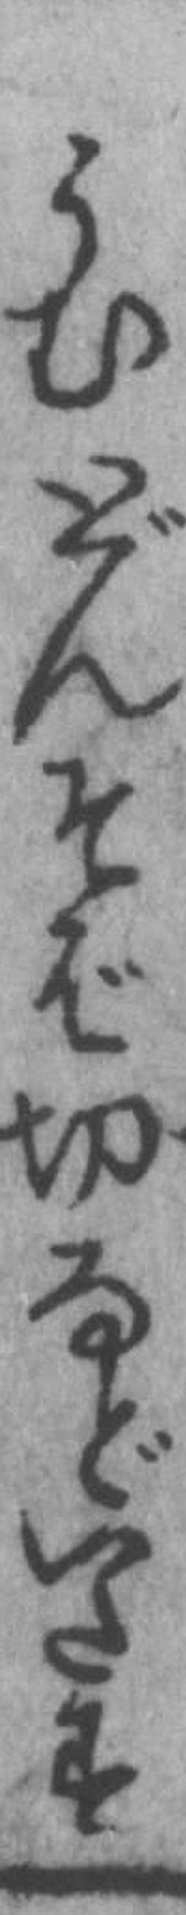うむどんそば切などいたす
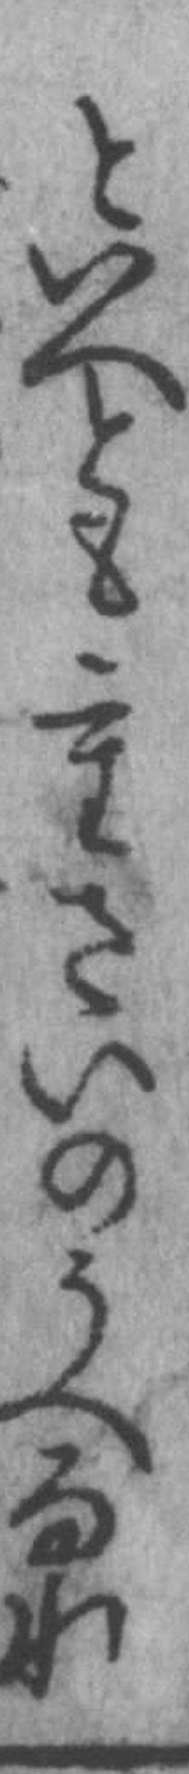といへともさいのうへなれ
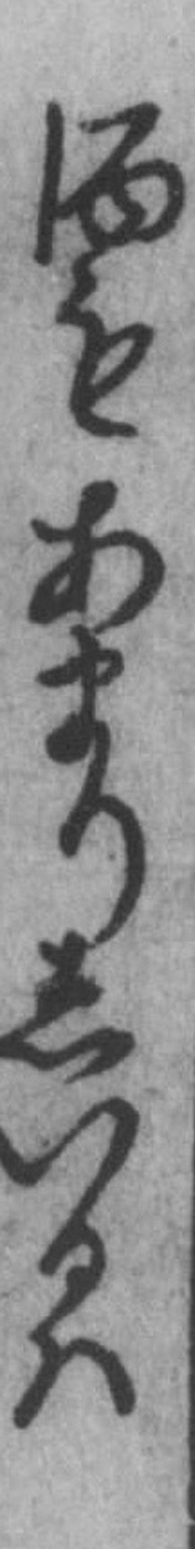酒をあまりしいるハ
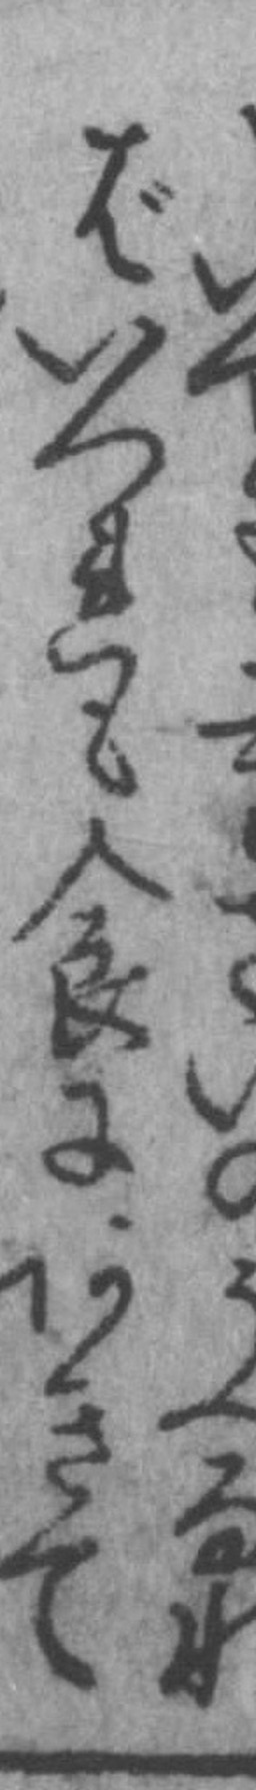ばいつまても食にあきて
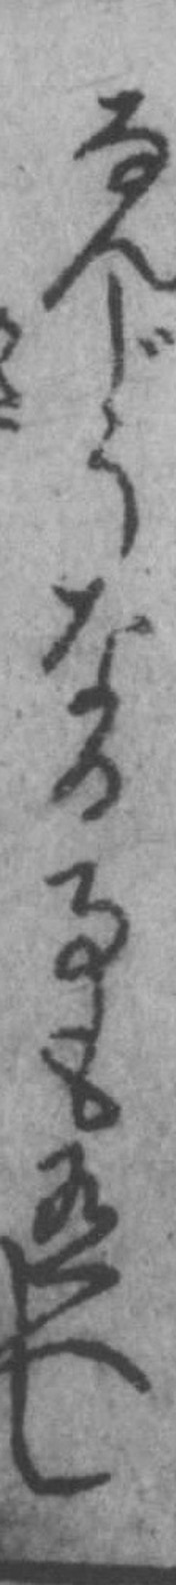なんじうなるもくへし
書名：料理献立抄
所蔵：大阪府立大学学術情報センター 国文学研究資料館
